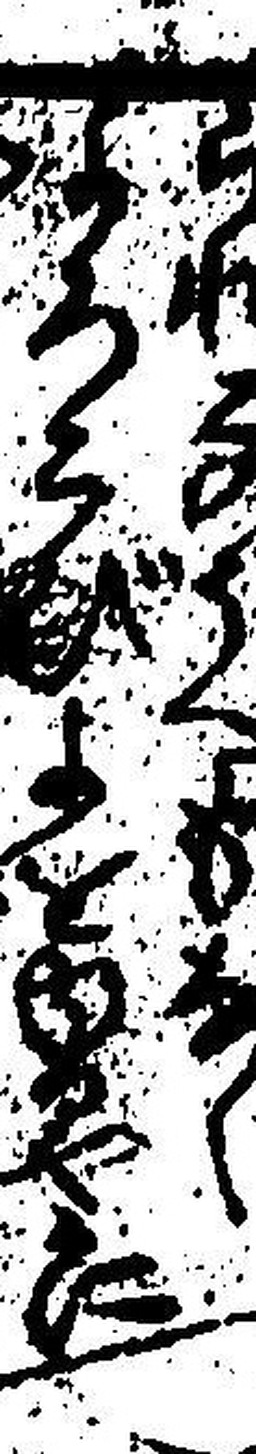よろこびよをゆるやかに
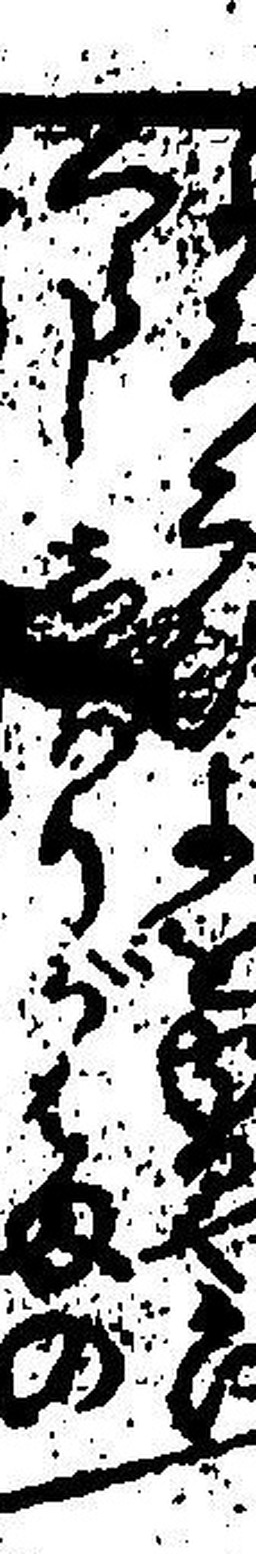くらししりがはまの
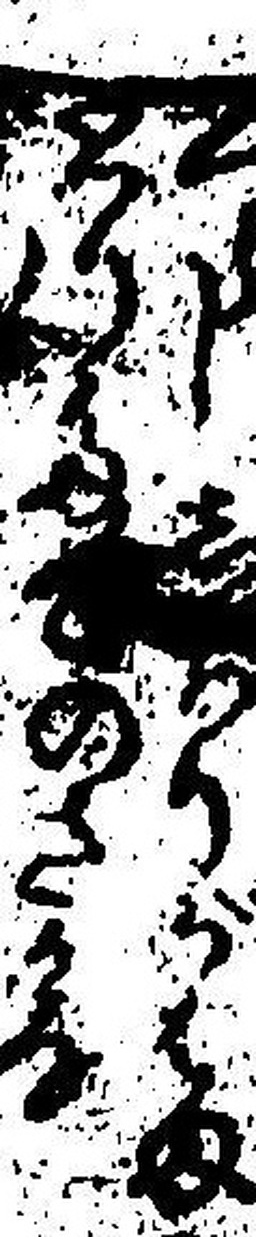とりたのさかな
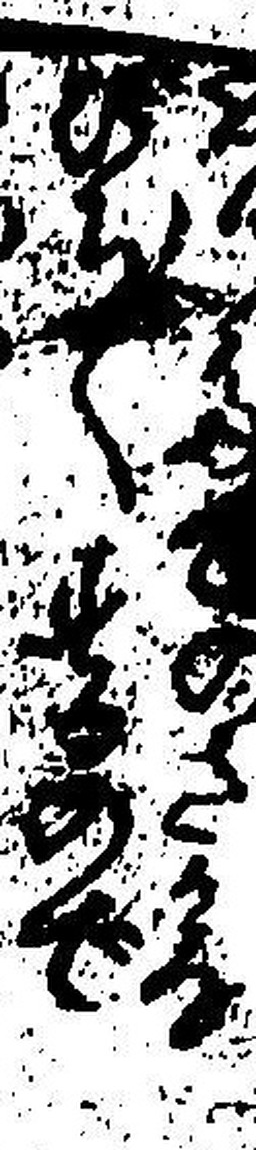びち〳〵するので

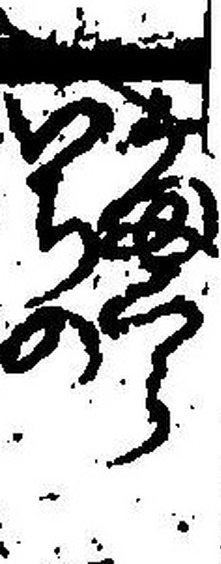いちの
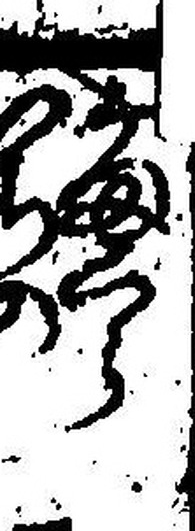かまくら
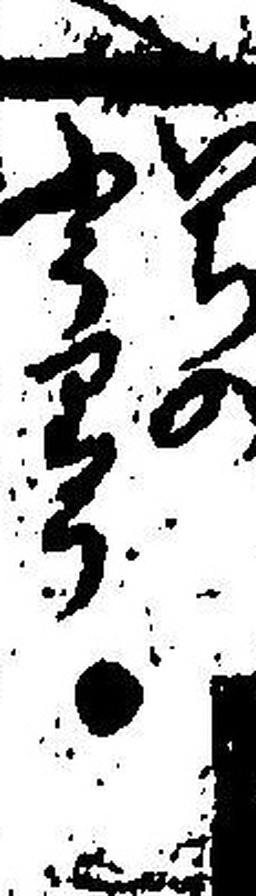ふうりう
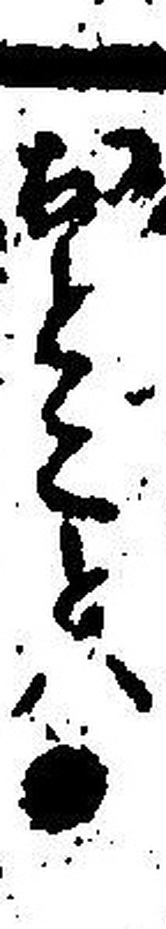おとことは
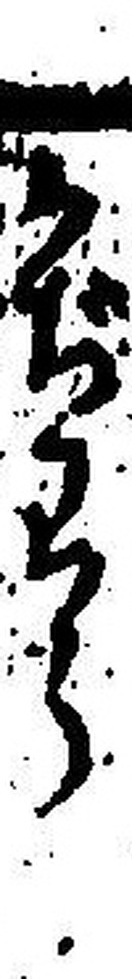かじわら
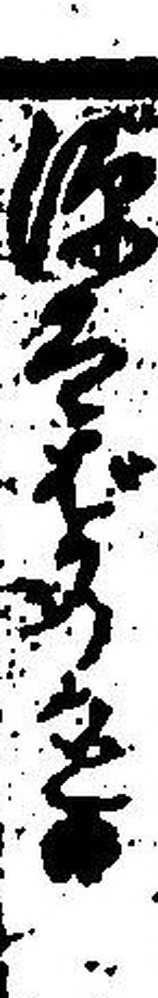源太ばかりかと
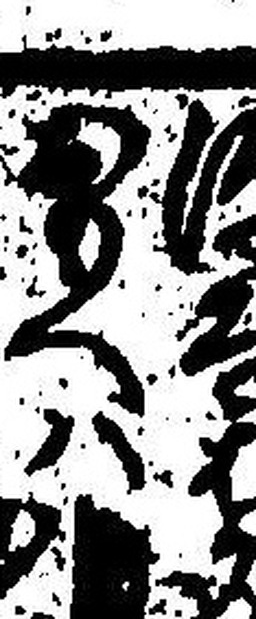おもへは
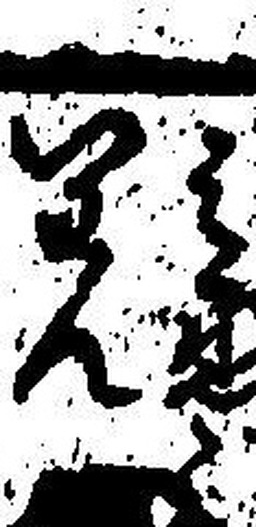いわん
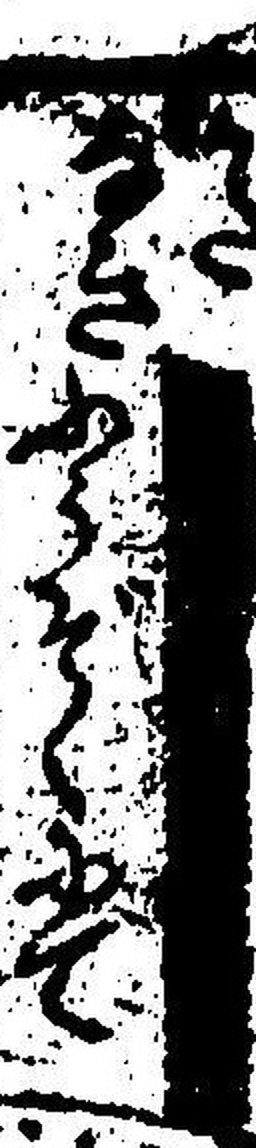なきふうぞくにて
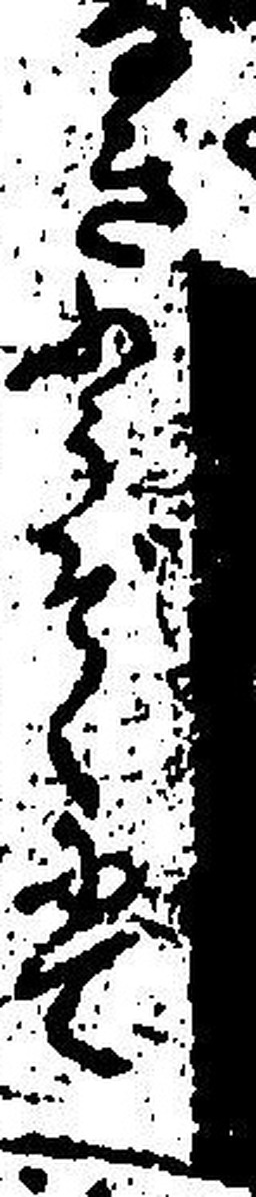なきふうぞくにて
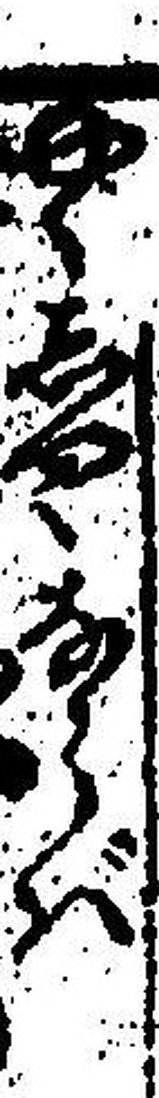やくしやならば
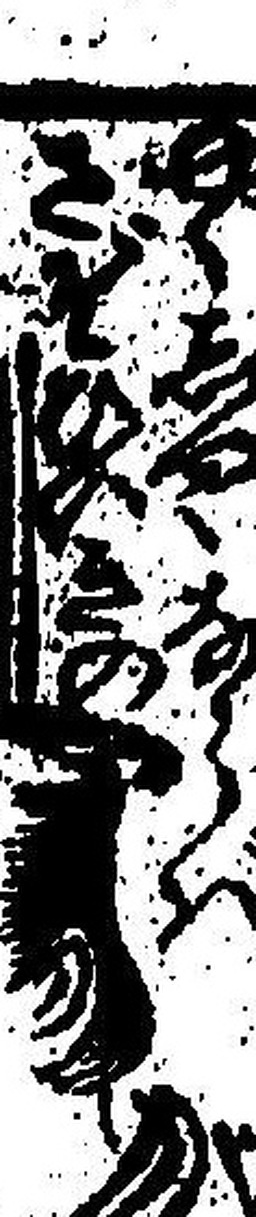さぞひいきの
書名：御代参牛時詣 / 市場通笑作
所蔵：東京大学総合図書館 General Library in the University of Tokyo, JAPAN
